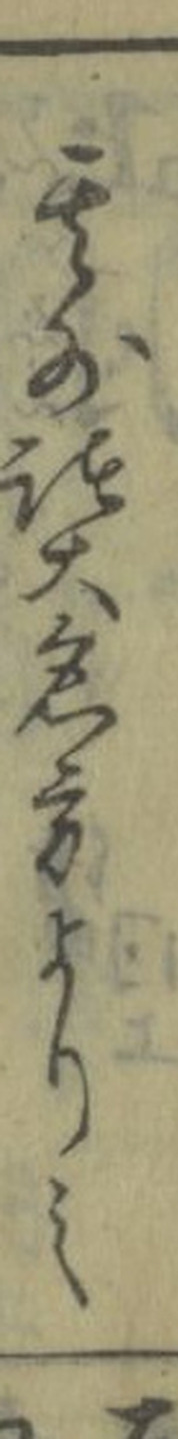其外諸大名方より之
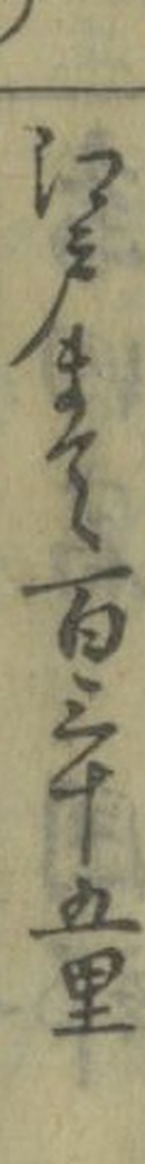江戸まて百三十五里
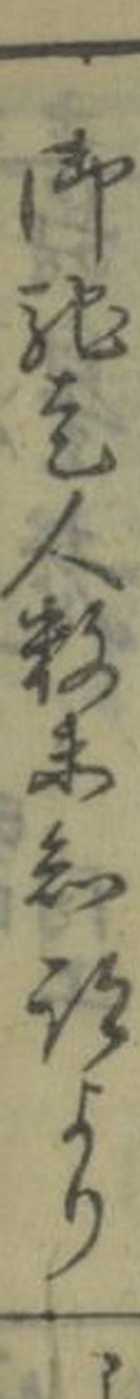御馳走人数未知跡より
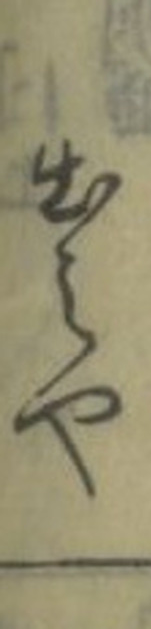出之や
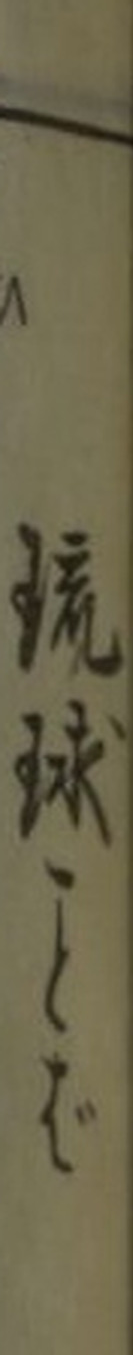琉球ことば
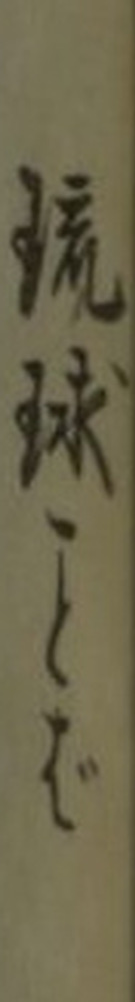琉球ことば
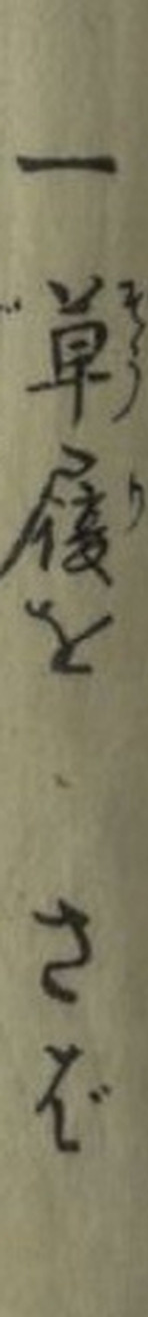一草履をさば
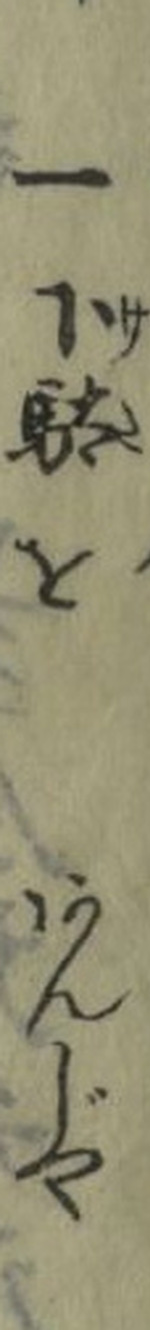一下駄をあんじや
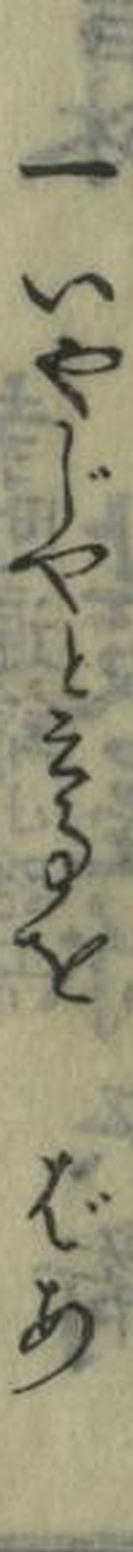一いやじやと云事をばあ
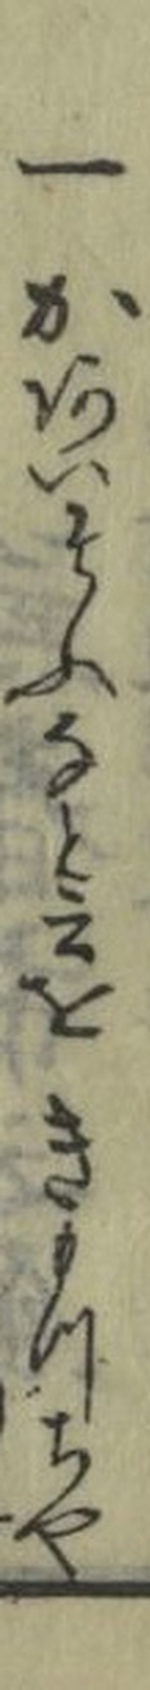一かあいそふなと云をきもつちや
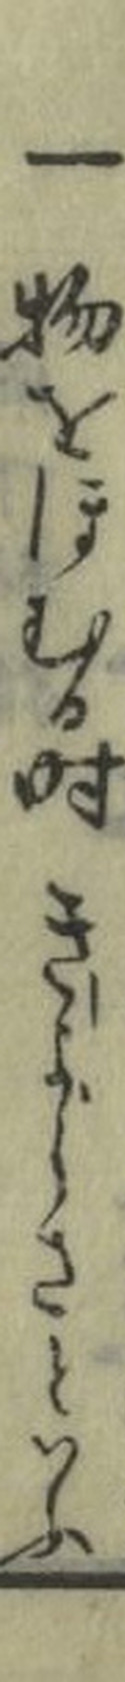一物をほむる時きよらさといふ
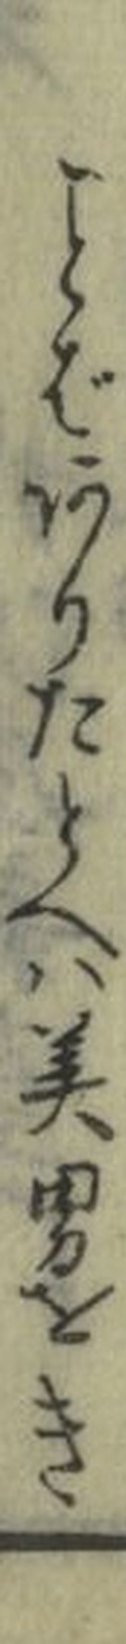ことばありたとへは美男をき
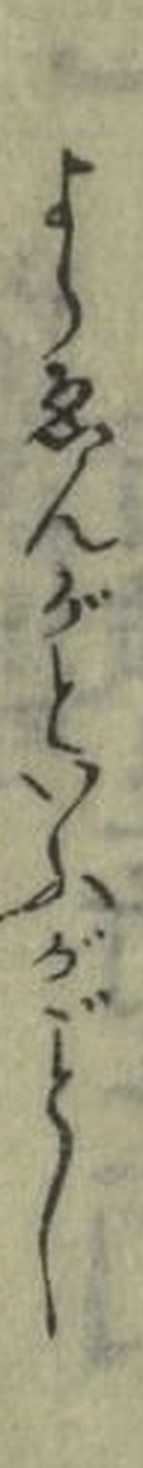よらゑんがといふがごとし
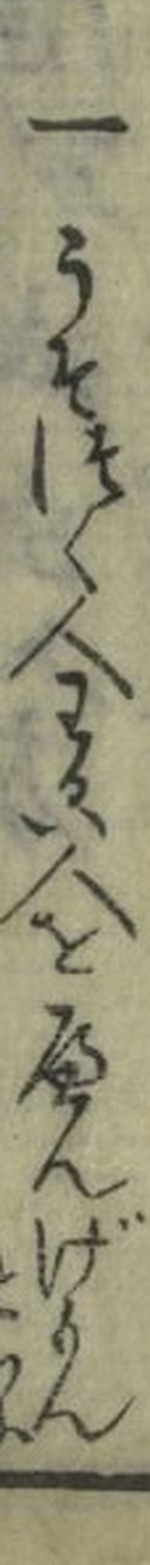一うそつく人わるい人をへんげもん
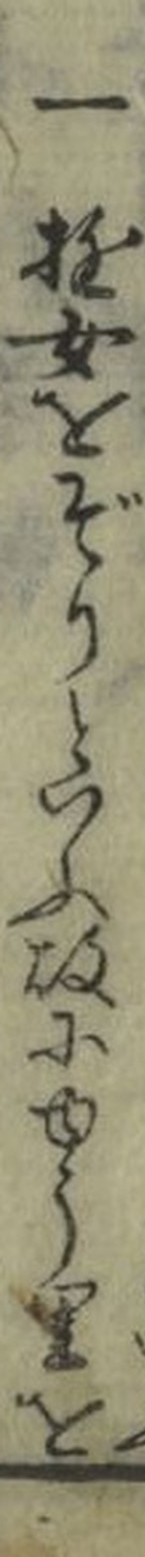一遊女をぞりといふ故にゆう里を
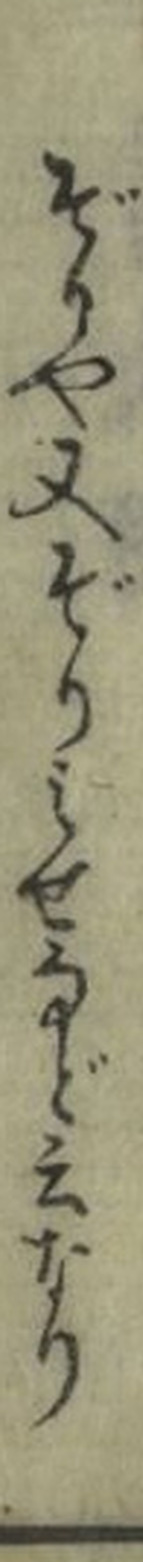ぞりや又ぞりみせなど云なり
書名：琉球人行列記
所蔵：University of the Ryukyus Library
